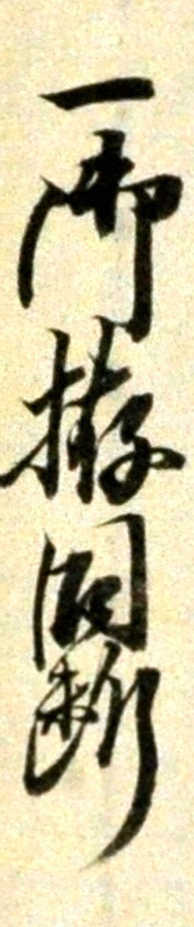一御拵同断
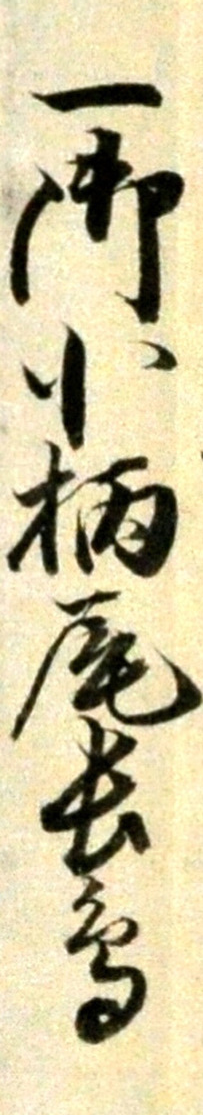一御小柄尾長鳥
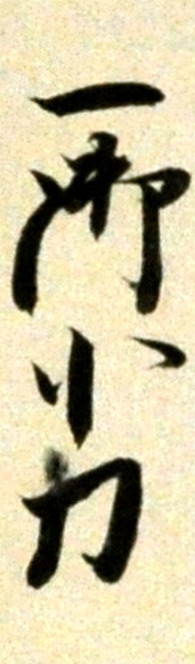一御小刀
